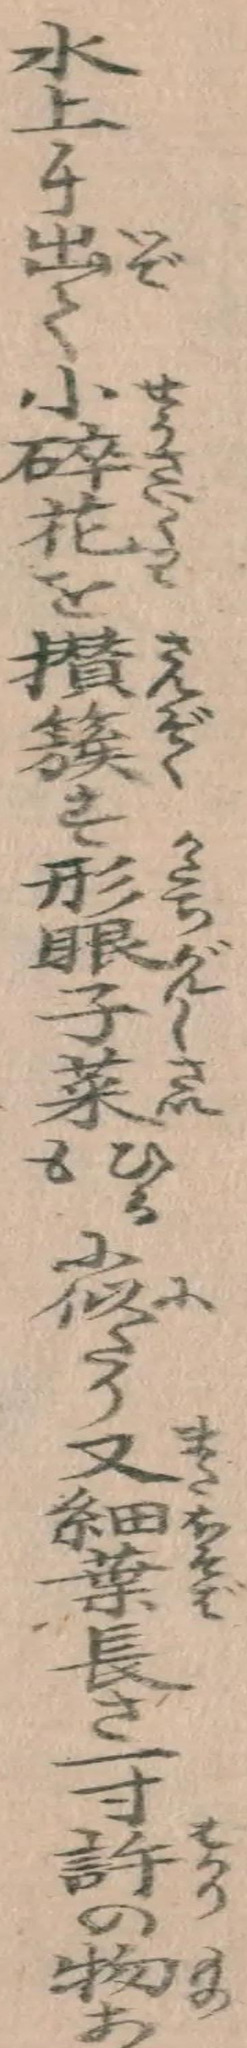水上に出て小砕花を攢簇す形眼子菜ひるもに似たり又細葉長さ一寸許の物あり
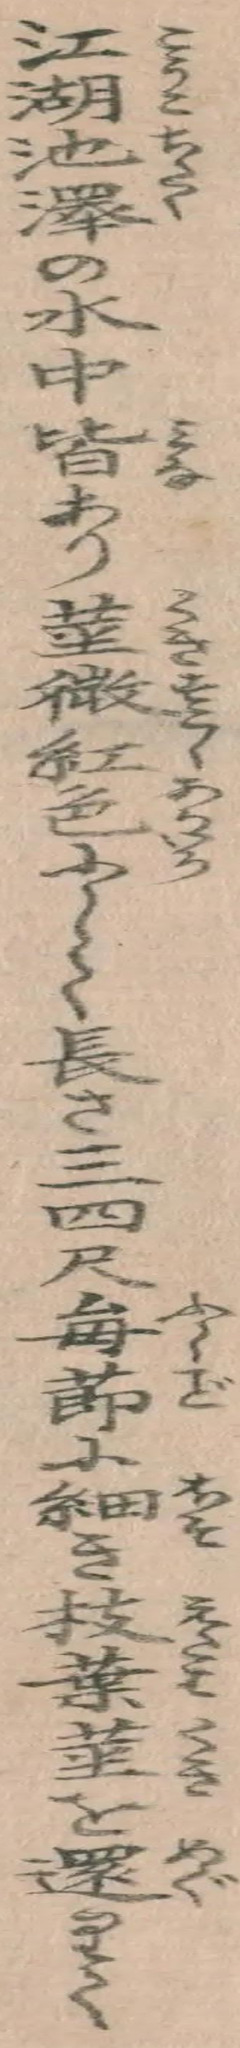江湖池沢の水中皆あり茎微紅色にして長さ三四尺毎節に細き枝葉茎を還りて
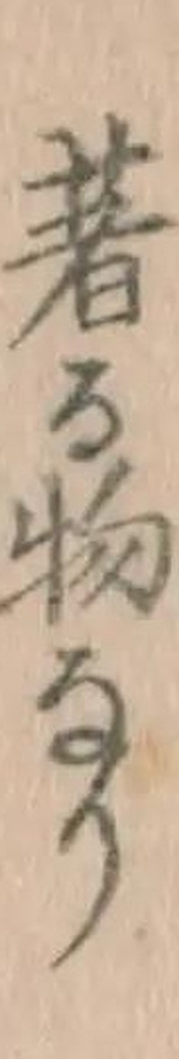著る物なり
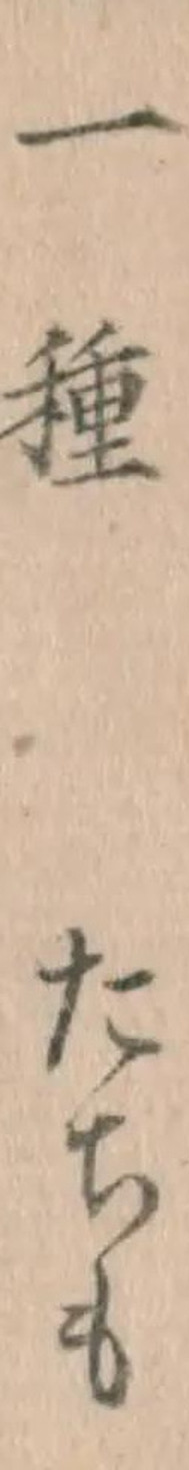一種たちも
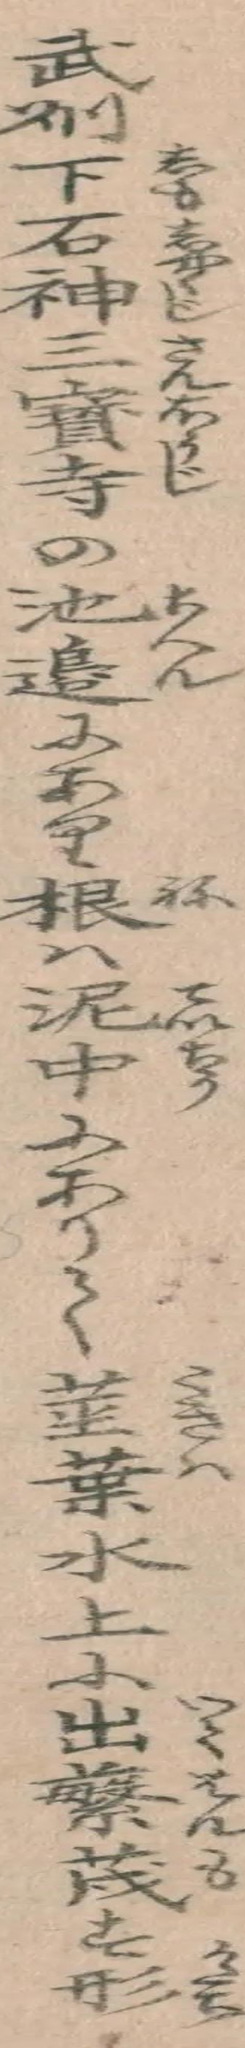武州下石神三宝寺の池辺にあり根は泥中にありて茎葉水上に出繁茂す形

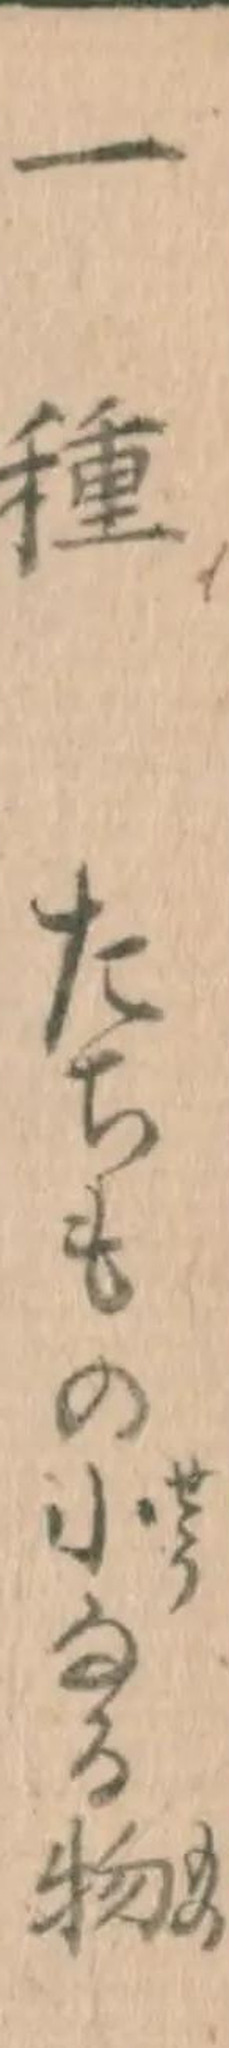一種たちもの小なる物
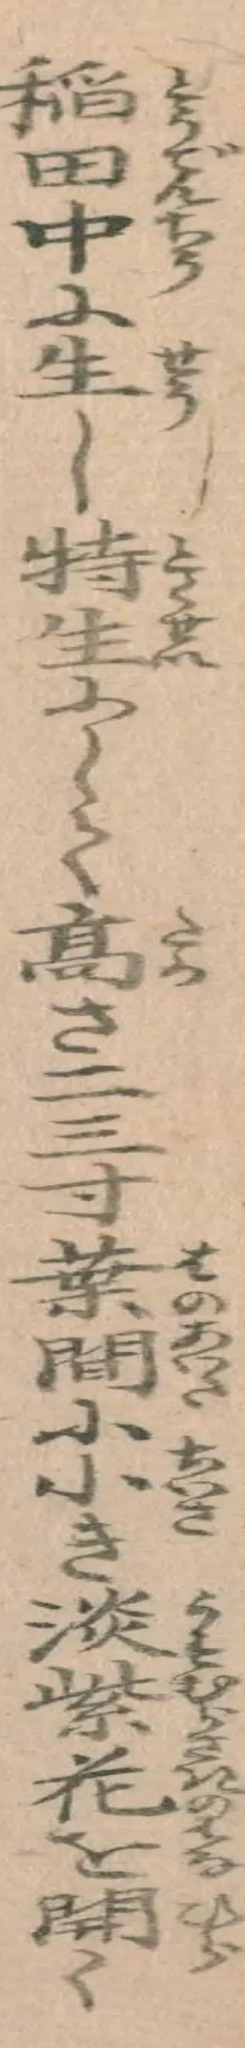稲田中に生し特生にして高さ二三寸葉間に小き淡紫花を開く
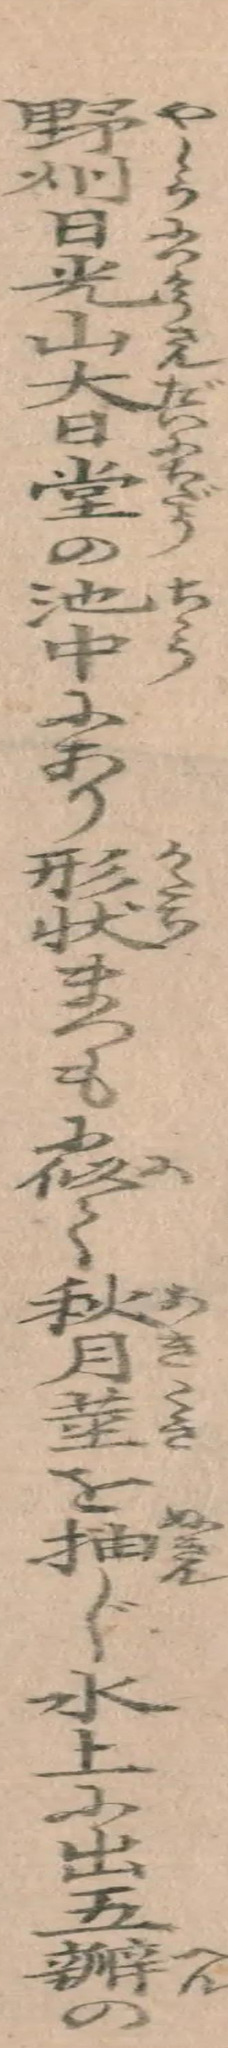野州日光山大日堂の池中にあり形状まつもに似て秋月茎を抽じ水上に出五弁の
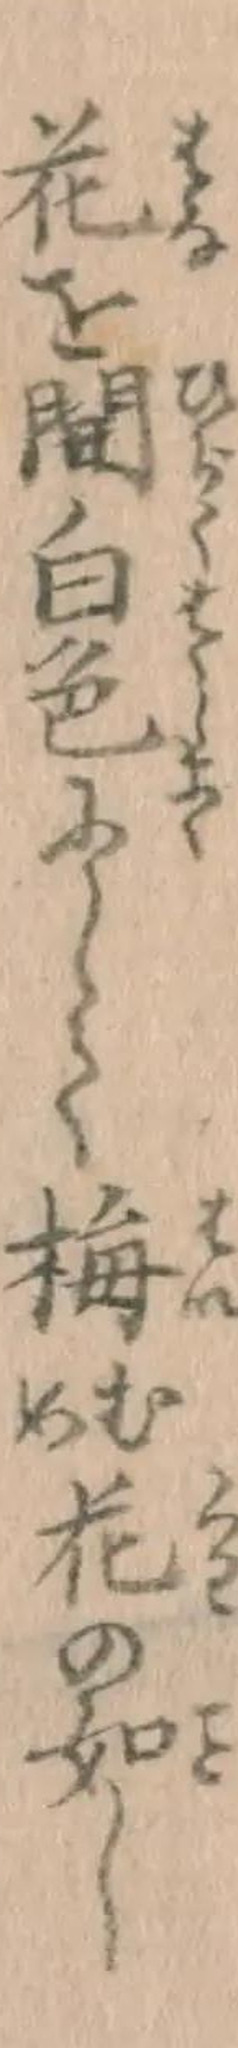花を開白色にして梅むめ花の如し
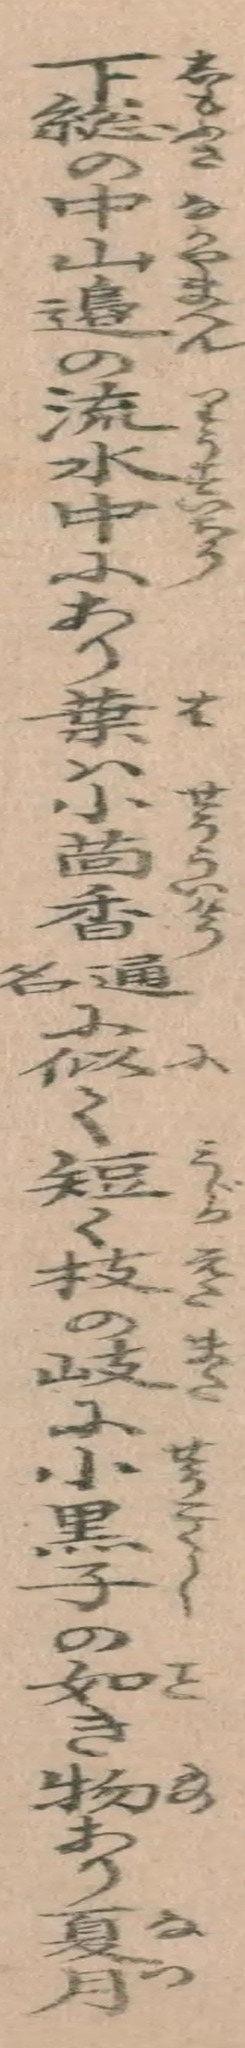下総の中山辺の流水中にあり葉は小茴香通名に似て短く枝の岐に小黒子の如き物あり夏月
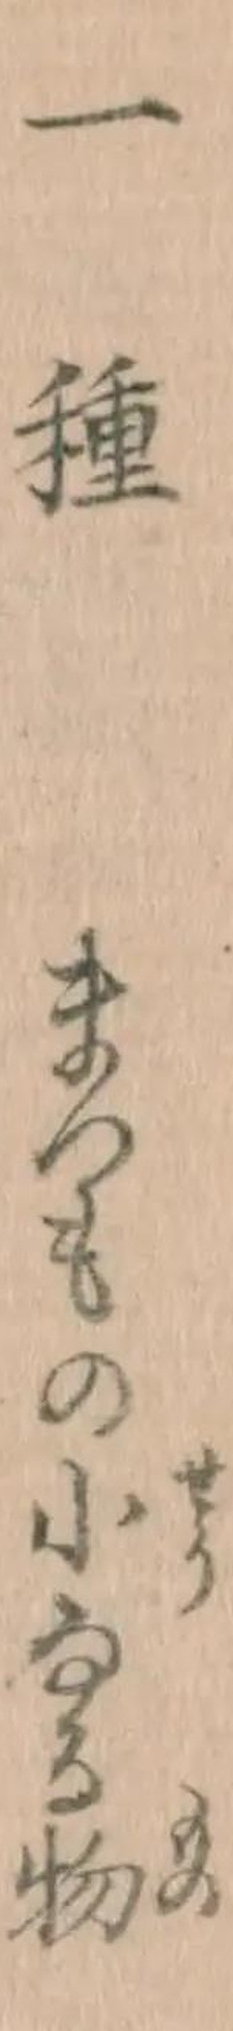一種まつもの小なる物
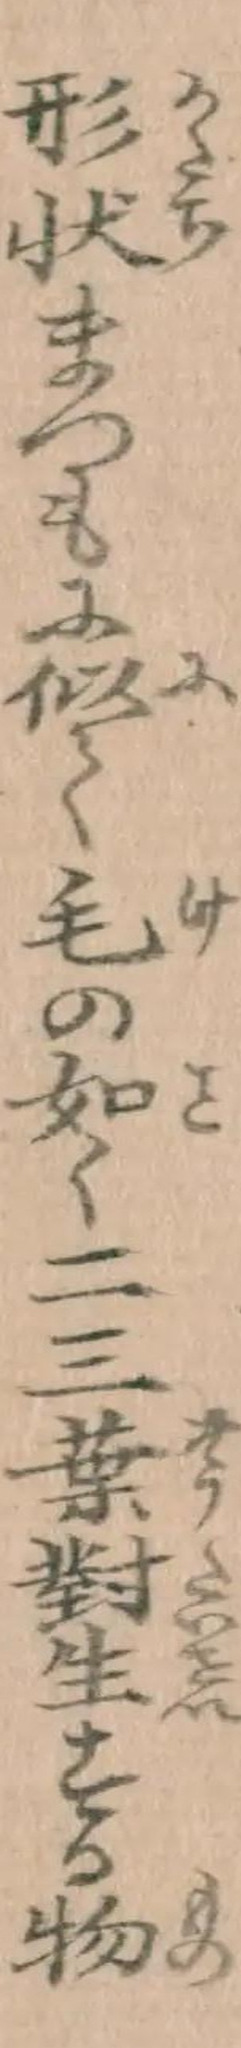形状まつもに似て毛の如く二三葉対生する物
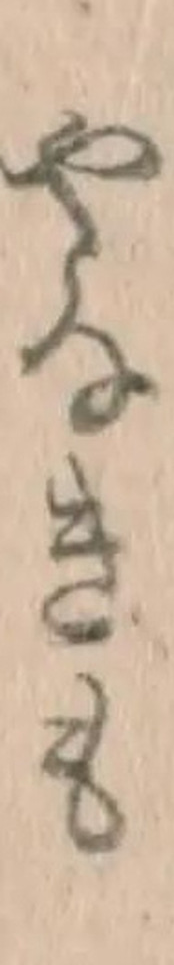やなきも

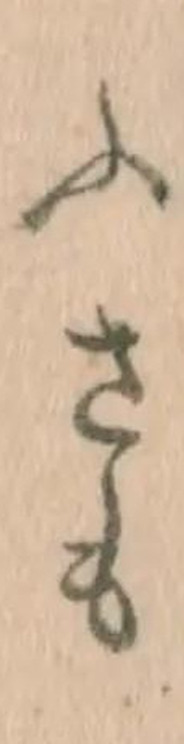ふさも
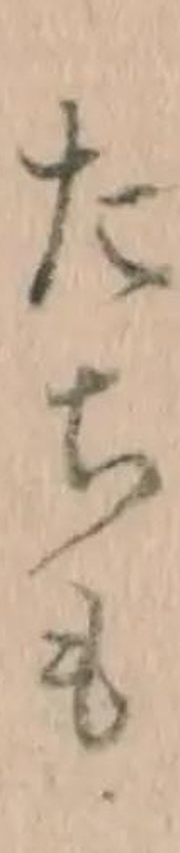たちも

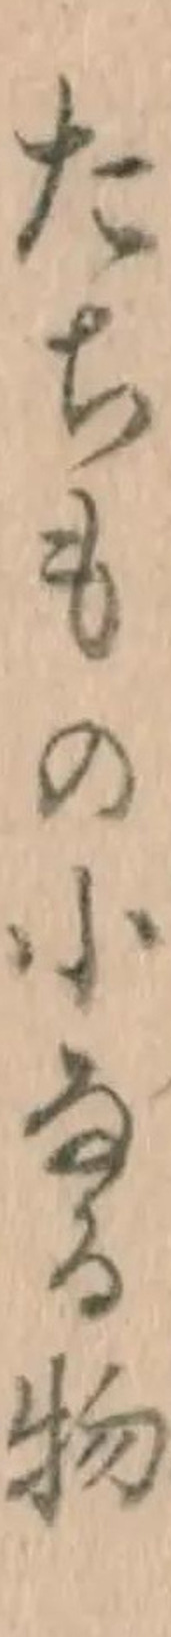たちもの小なる物
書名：本草図譜. 巻34-36
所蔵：国立国会図書館 National Diet Library, JAPAN
